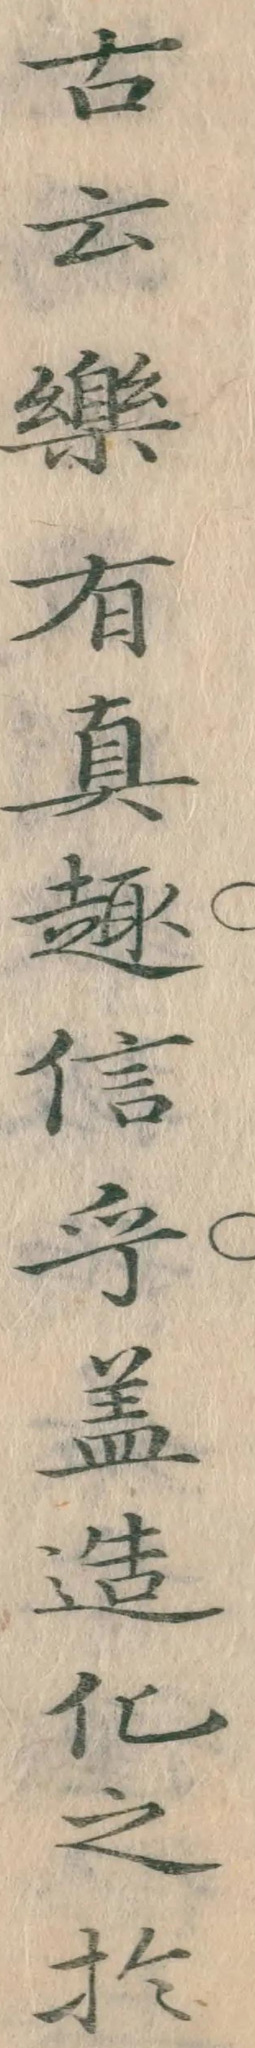古云楽有真趣信乎蓋造化之於
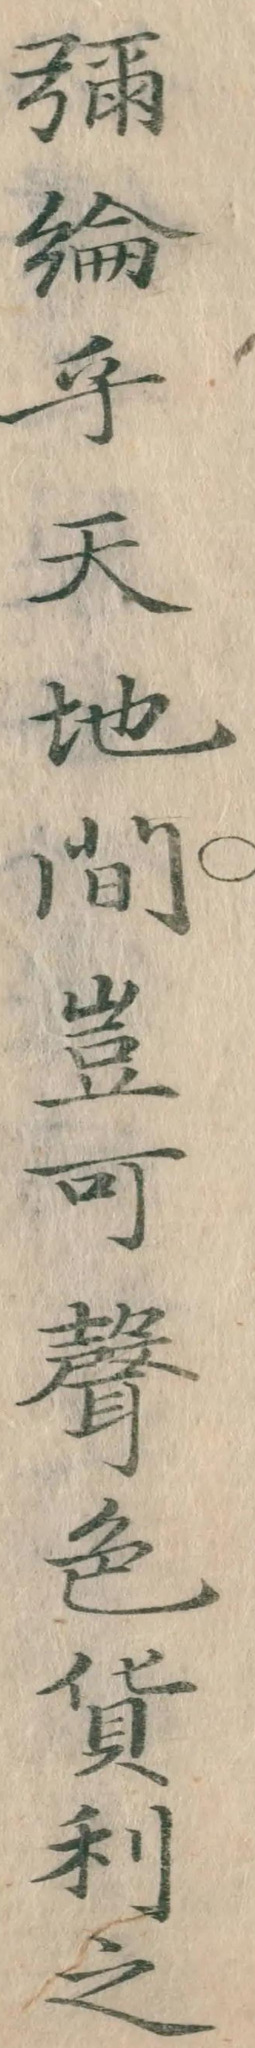弥綸乎天地間豈可声色貨利之
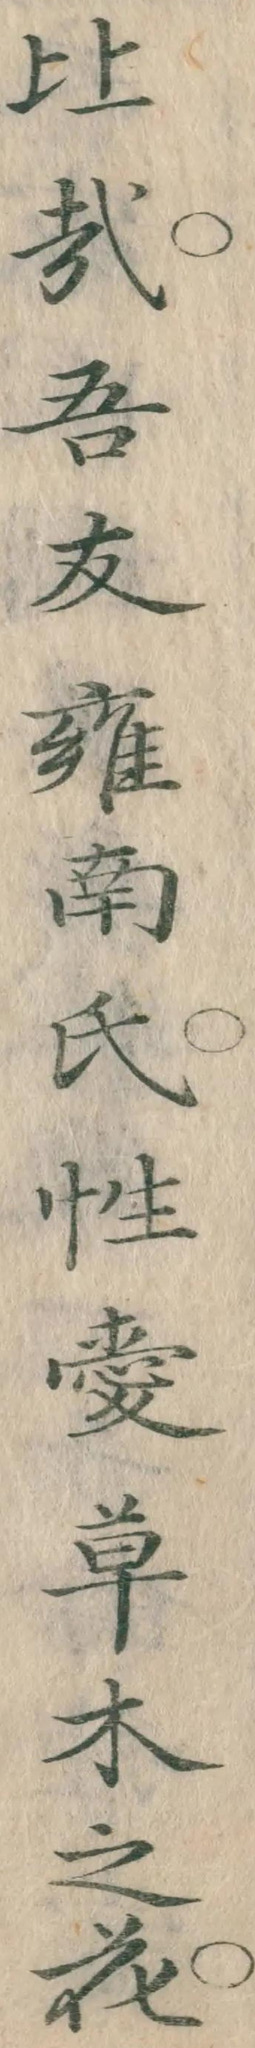比哉吾友雍南氏性愛草木之花

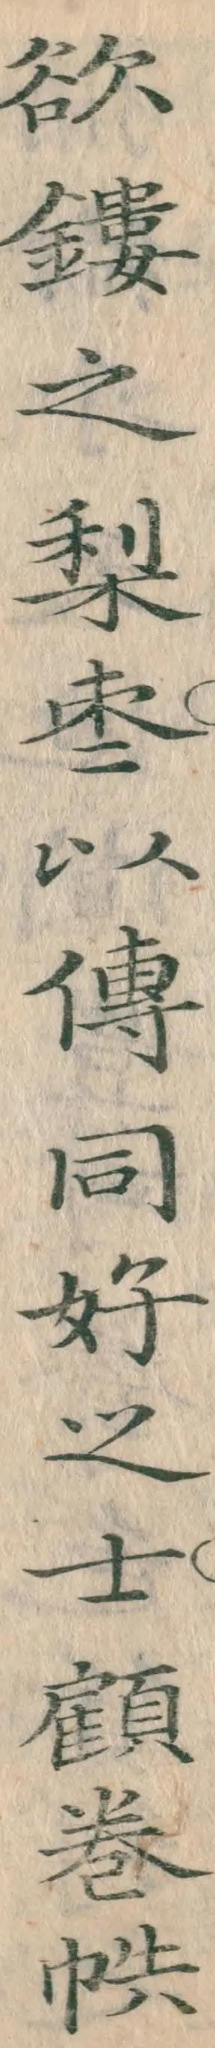欲鏤之梨棗以伝同好之士顧巻帙
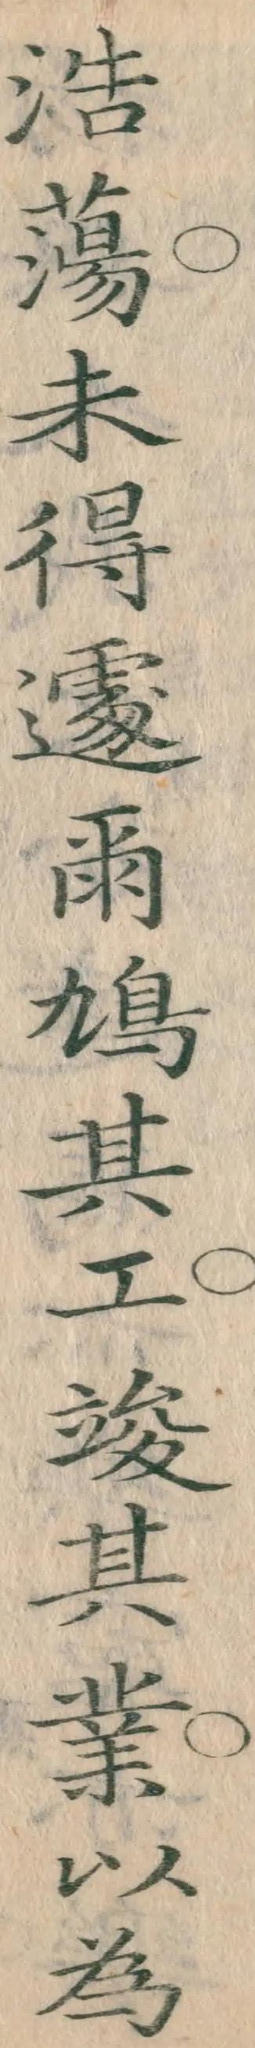浩蕩未得遽爾鳩其工竣其業以為
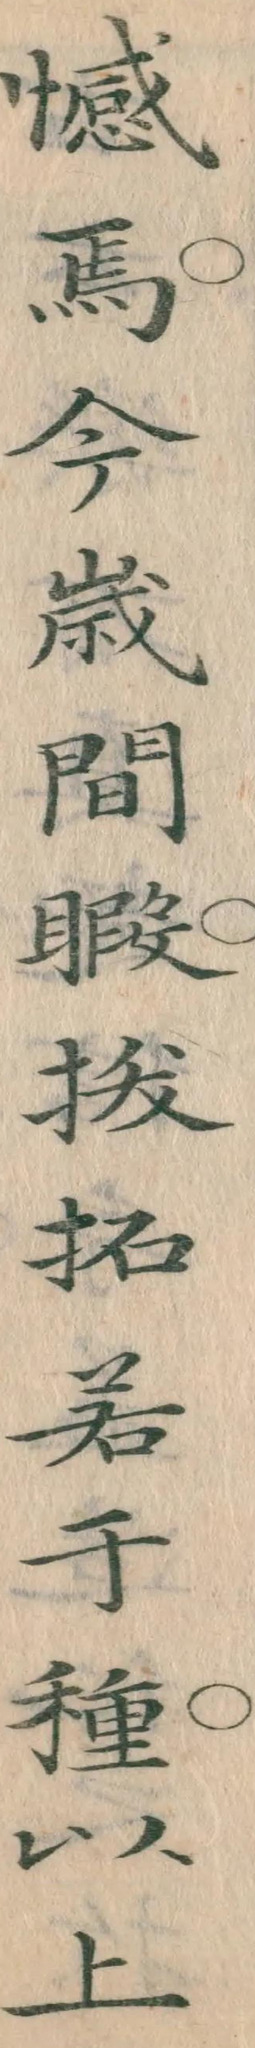憾焉今歳間暇抜拓若干種以上
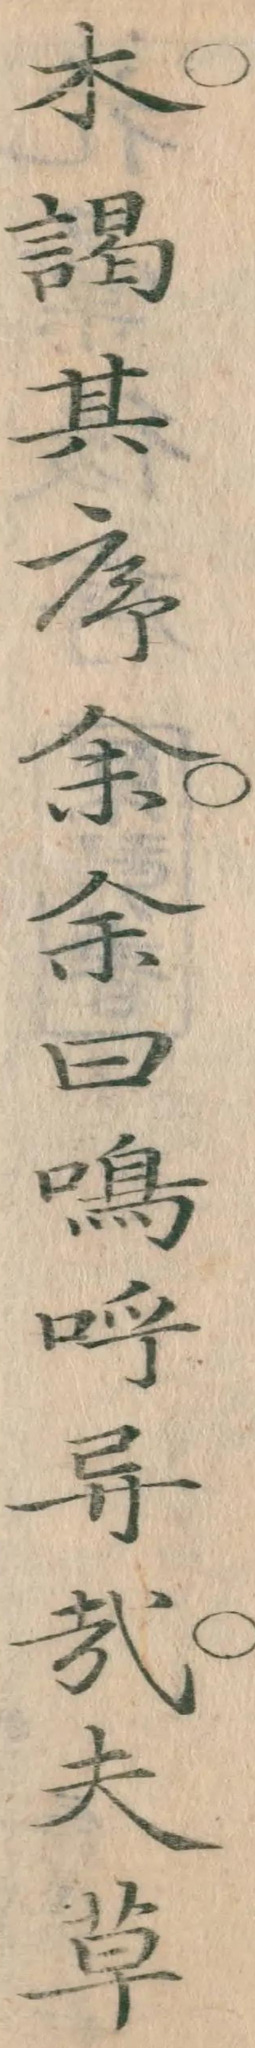木謁其序余余曰鳴呼异哉夫草
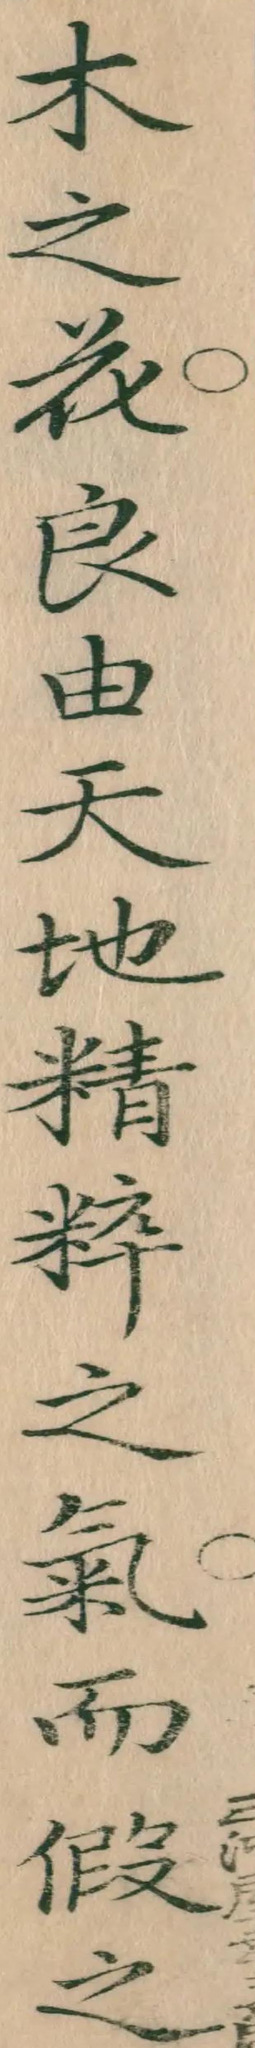木之花良由天地精粋之気而仮之
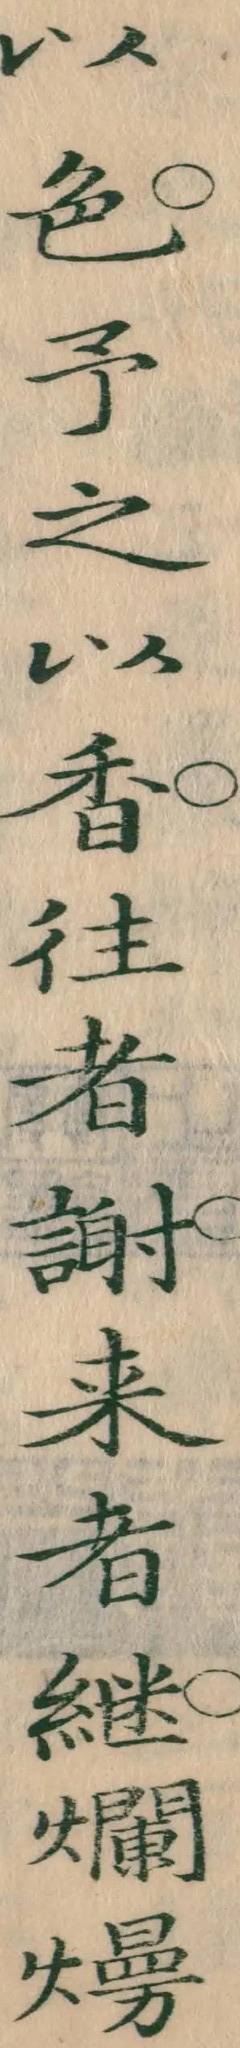以色予之以香往者謝来者継爛熳
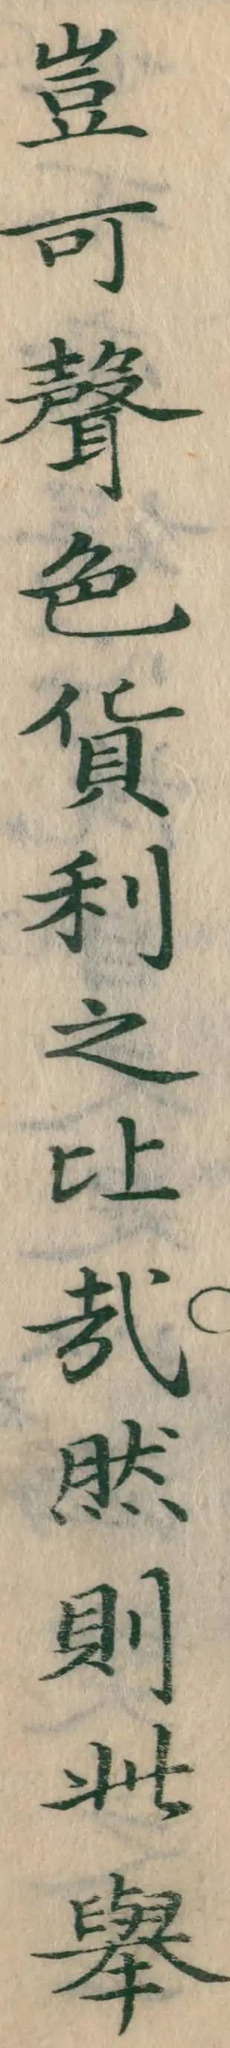豈可声色貨利之比哉然則此挙

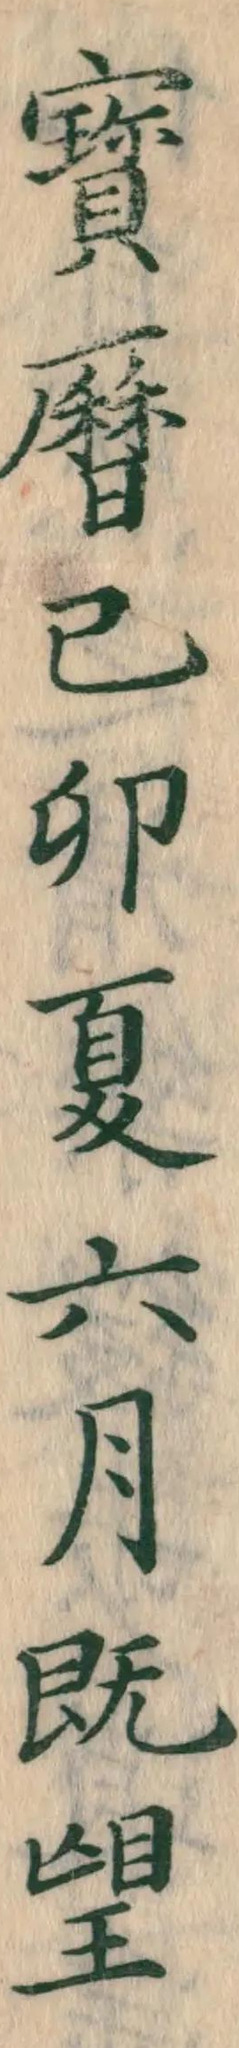宝暦己卯夏六月既望
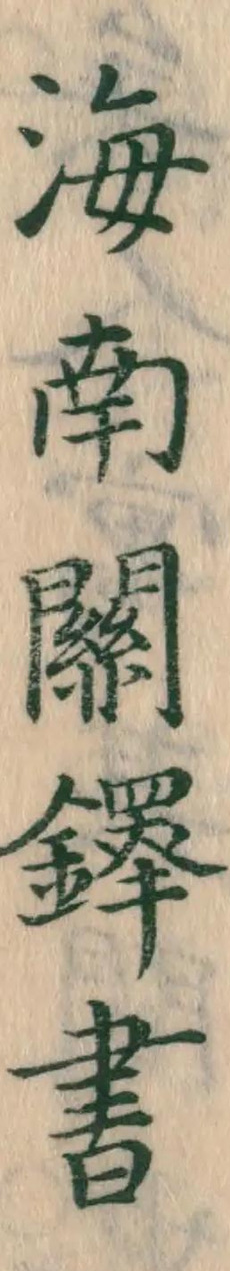海南関鐸書
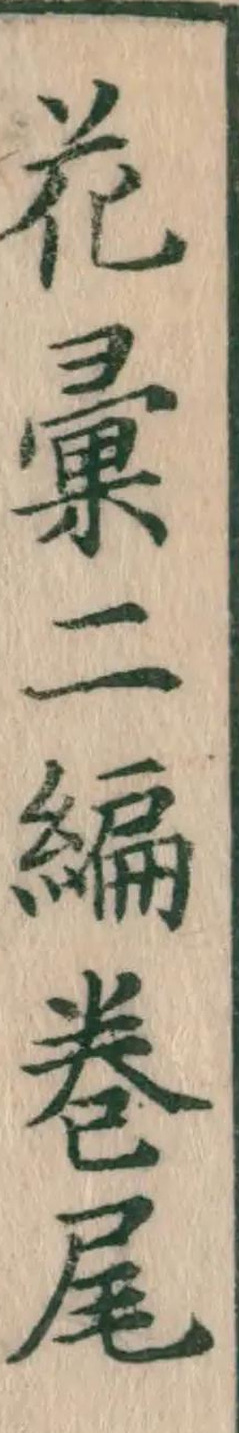花彙二編巻尾
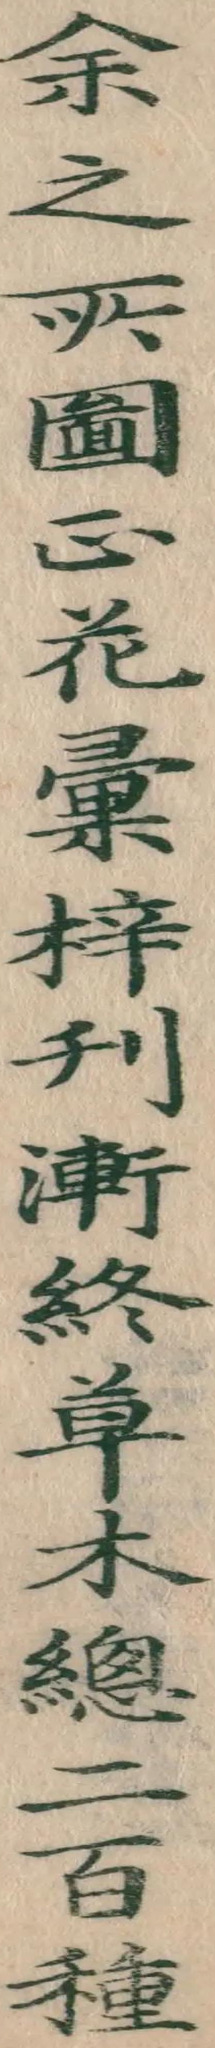余之所図正花彙梓刊漸終草木総二百種
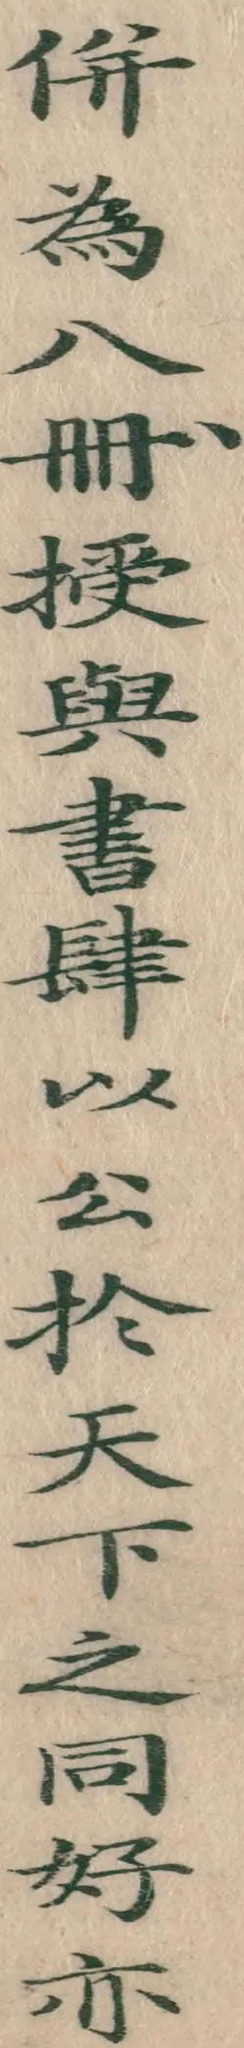併為八冊授与書肆以公於天下之同好亦
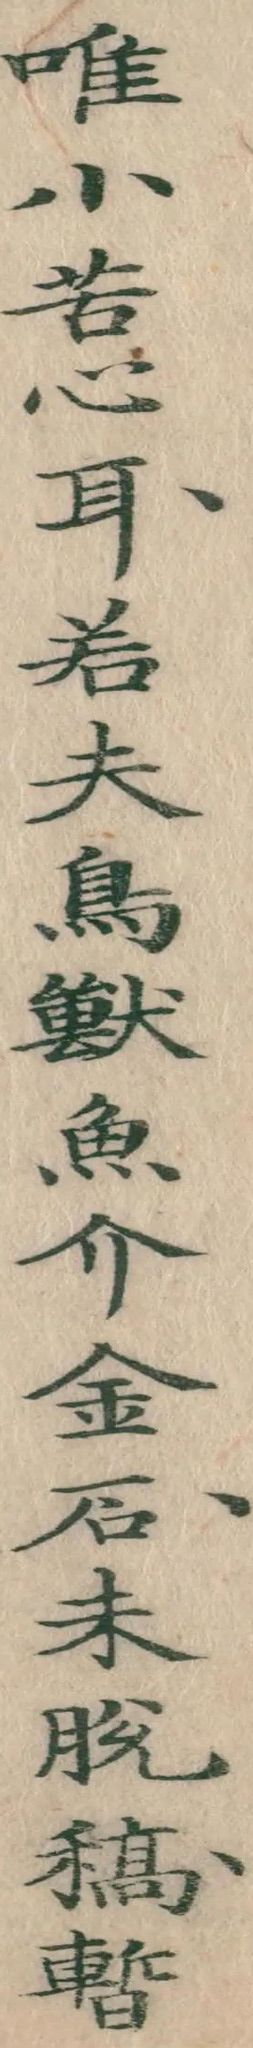唯小苦心耳若夫鳥獣魚介金石未脱稿暫
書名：花彙 草部4巻木部4巻. [2]
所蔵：国立国会図書館 National Diet Library, JAPAN
